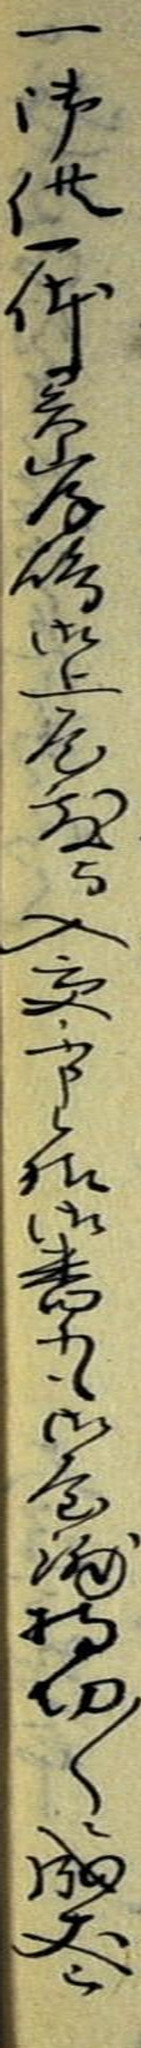一御供一体霊岸嶋御上屋敷与入交不申候様御番等も御屋鋪持切〳〵に成丈被
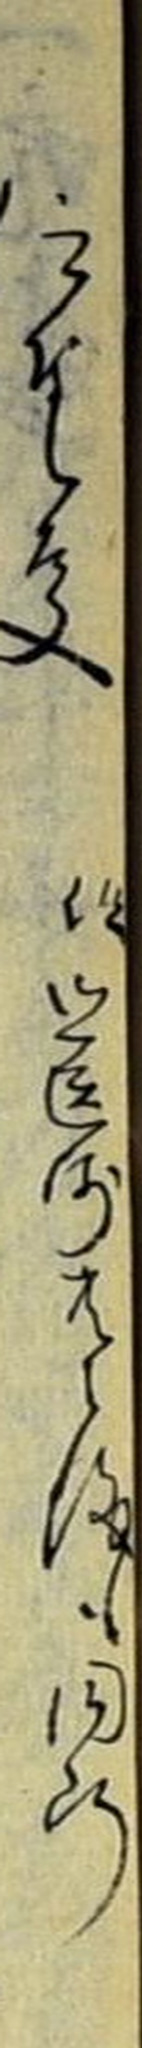仰付候事但御医師共之儀も同断
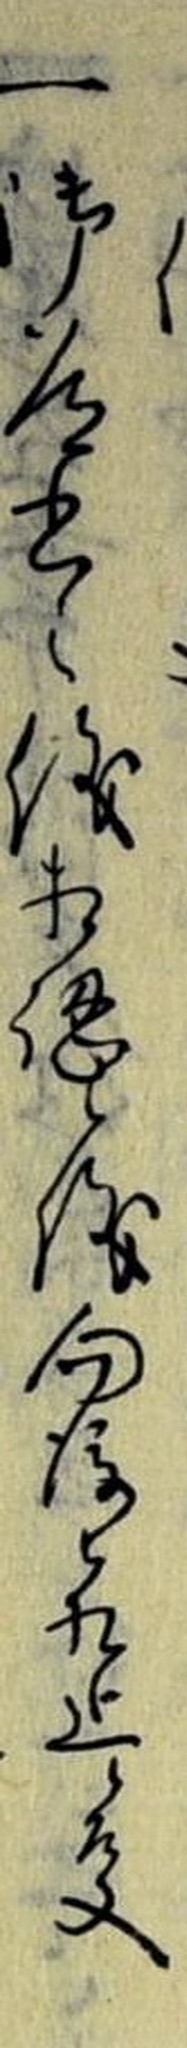一御道書之儀相認候儀向後被相止候事
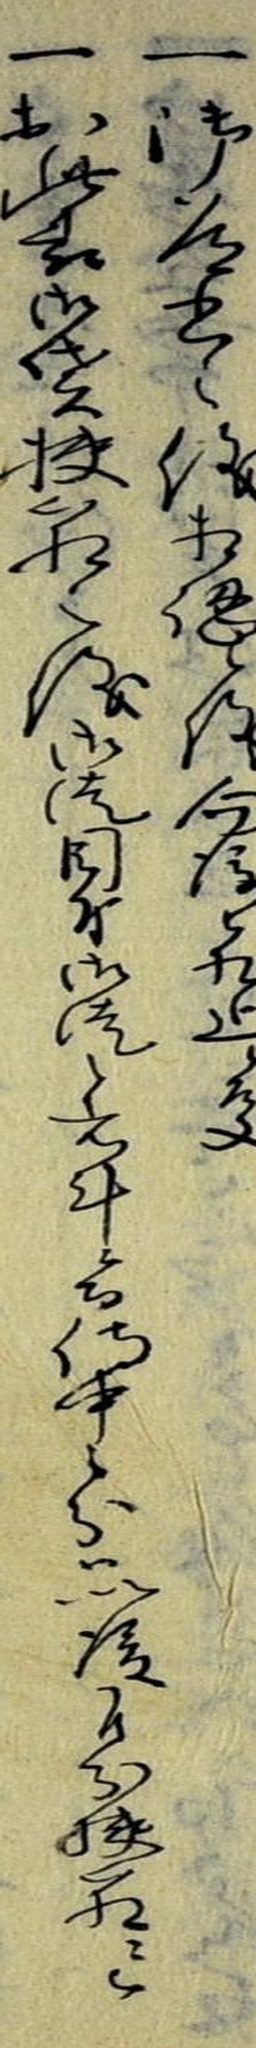一於此表御貸挟箱之儀御徒目付御徒之者斗に而侍中之分は以後自分挟箱に被
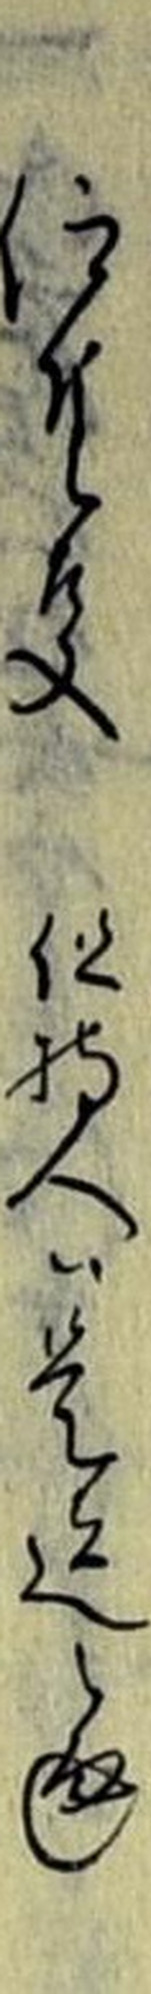仰付候事但持人は是迄之通
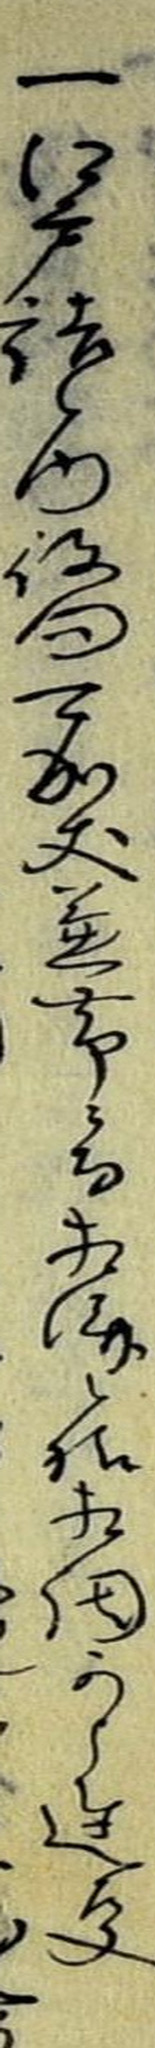一江戸詰之内役向可成丈兼帯に而相済候様相調可申達事
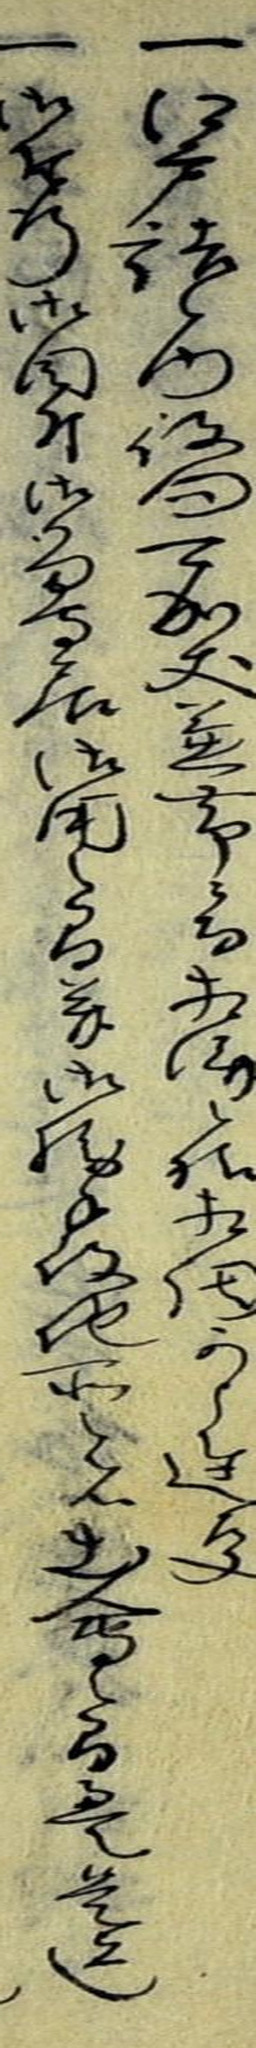一御奉行御目付御留守居御用之間并御勝手役他所之者出会之間畳是迄
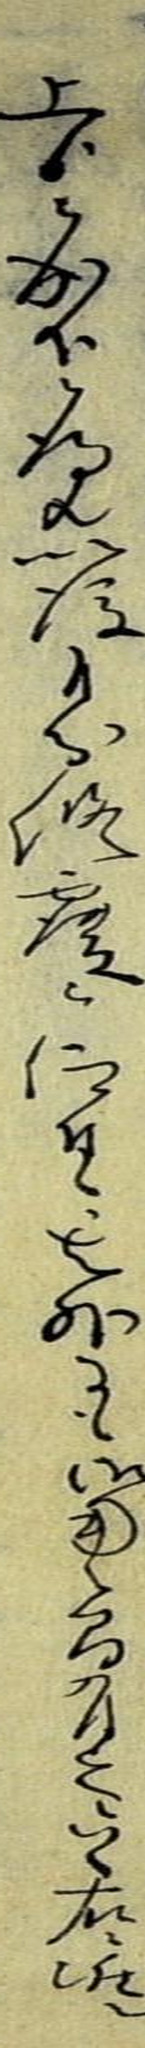上ゟ被成下候得共以後自分修覆被仰付候其外にも御用之間有之候はゝ右に准し
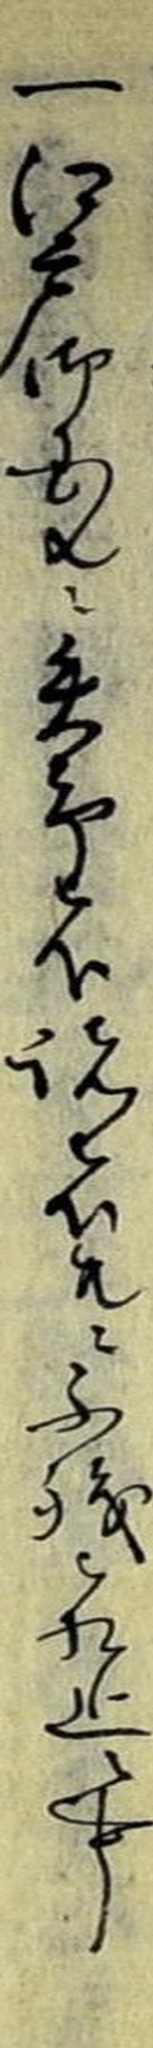一江戸御国共に失却被下諸被下共に不残被相止候事
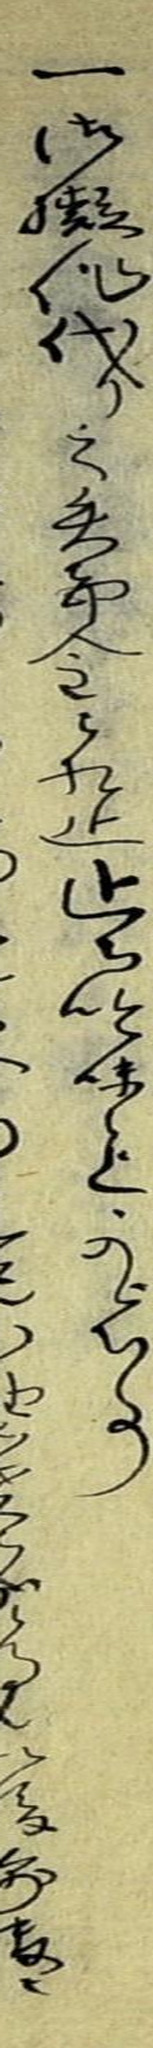一御擬作代り之失却金被相止追而吟味之上可被下事
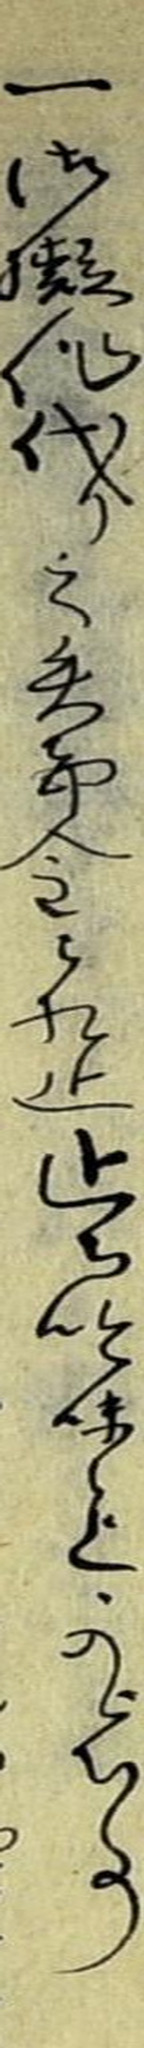一御擬作代り之失却金被相止追而吟味之上可被下事
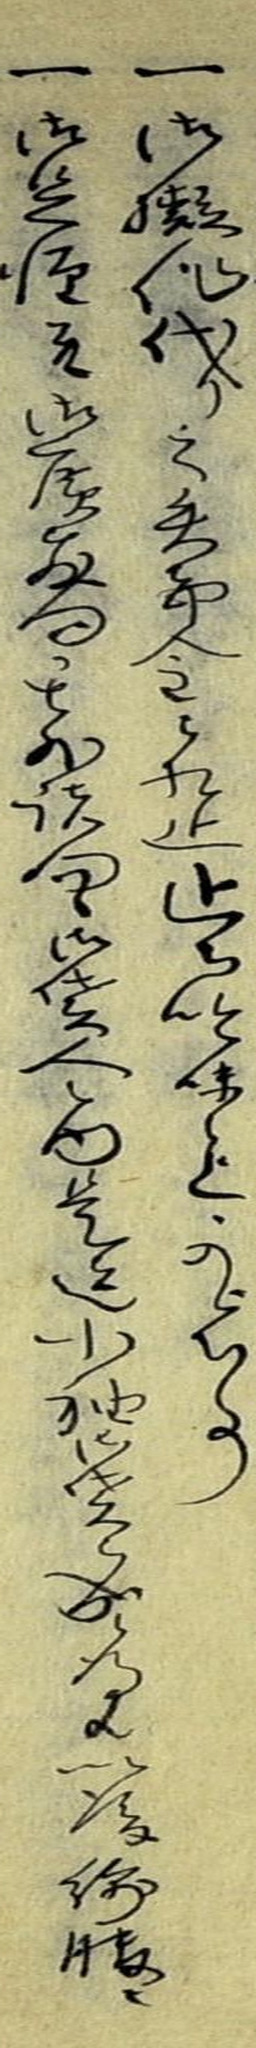一御足軽共御広敷向其外諸向へ御貸人の内是迄小袖御貸被成候得共以後綿服に
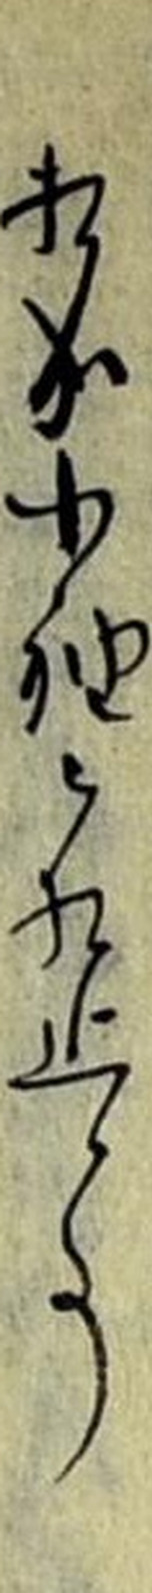相成小袖被相止候事
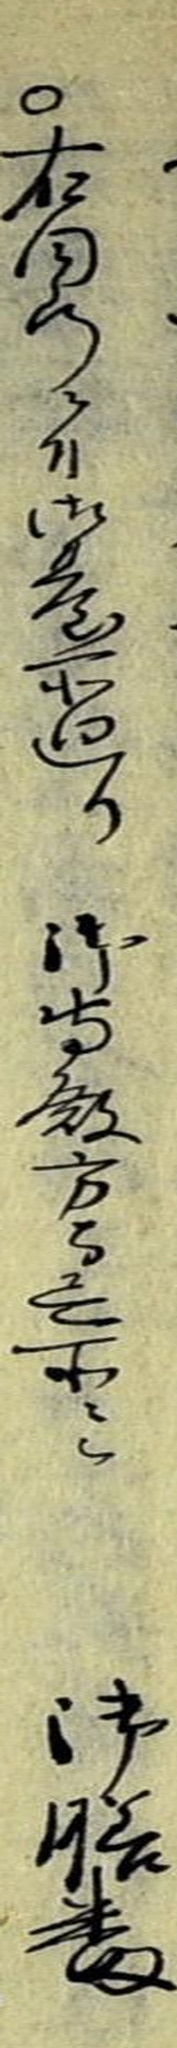〇右同断に付御台所廻り御守殿方与壱所に被御膳番
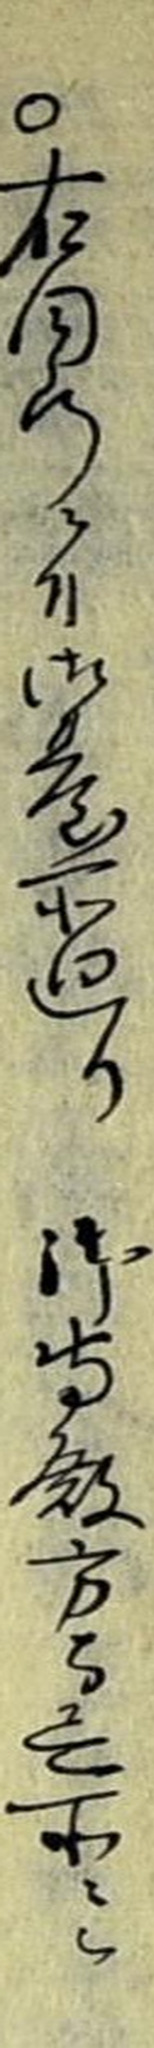〇右同断に付御台所廻り御守殿方与壱所に被御膳番
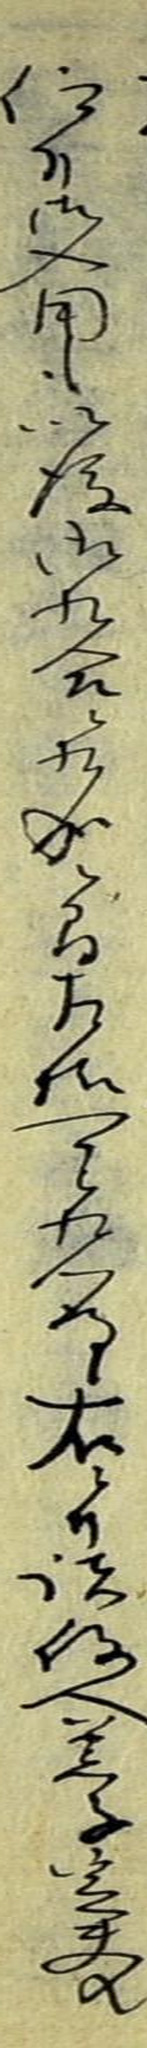仰付御入用も以後御相合に相成候間左様可被相心得候右に付諸役人荒子定不夫共
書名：命令之部 二
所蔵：福井県文書館 Fukui Prefectural Archives
